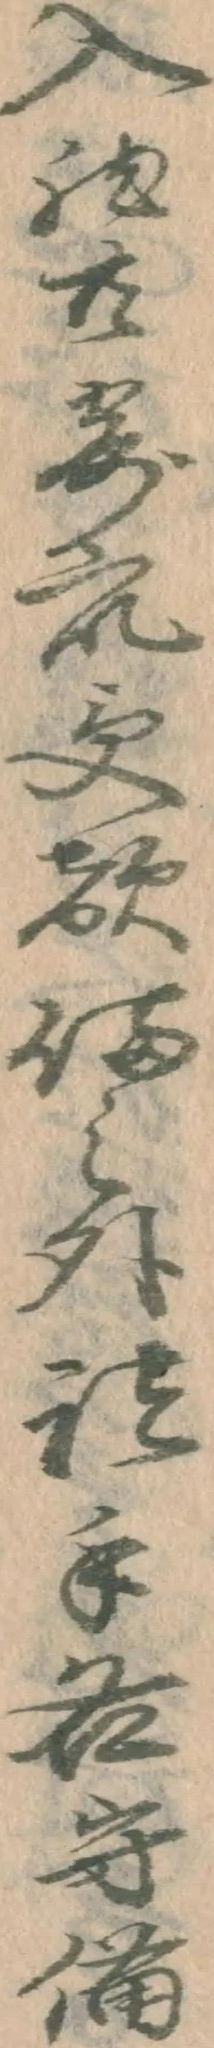入然共寄衆受敵備之外諸手各守備
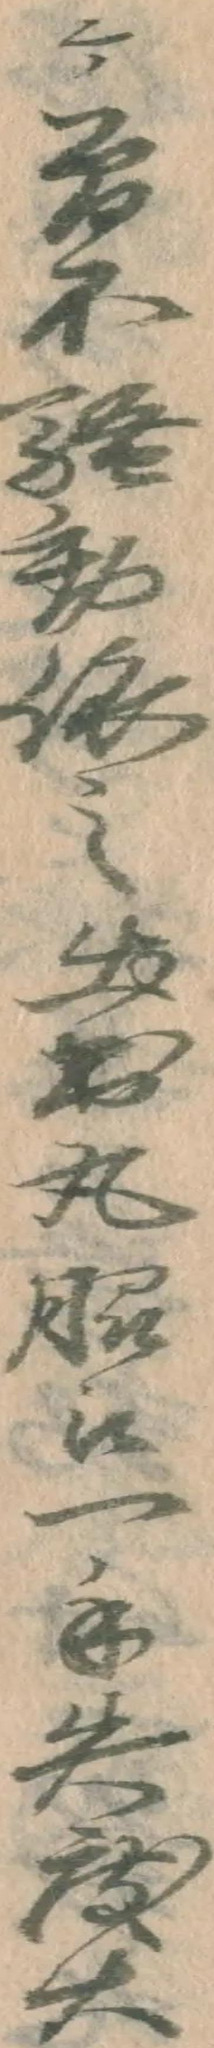け曽不騒動依之出出丸脇江一手失度大
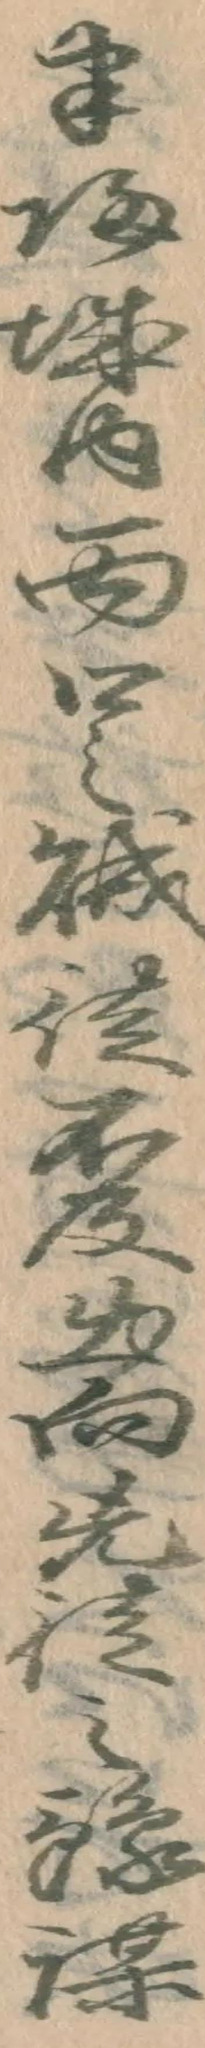半帰城内両口之賊徒不及出向凶徒之豫謀
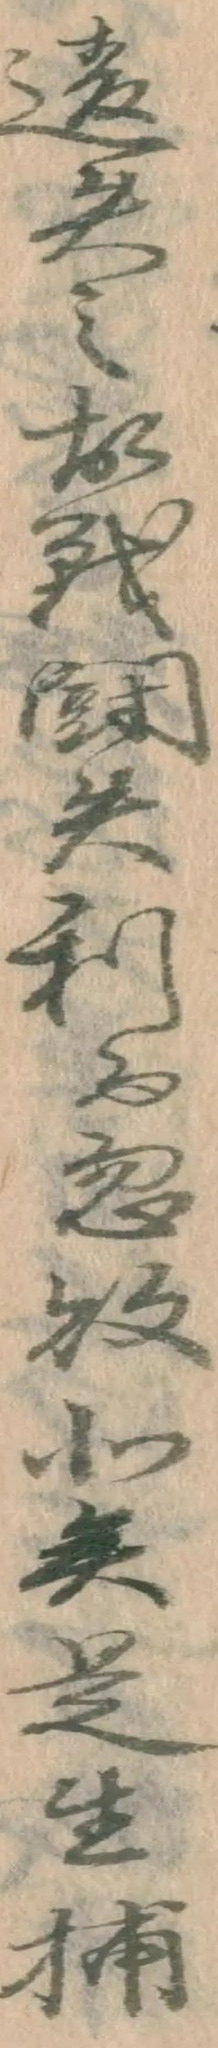違失之故戦闘失利而忽敗北矣是生捕
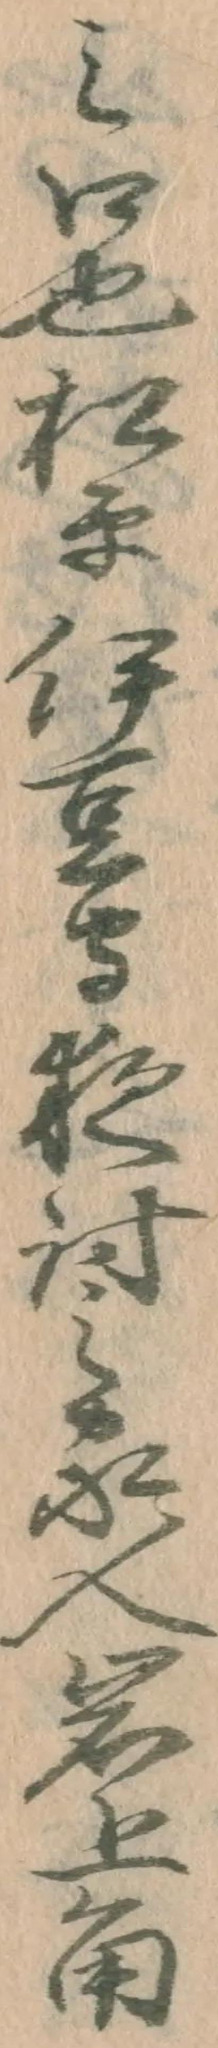之口也松平伊豆守夜討之家人岩上角
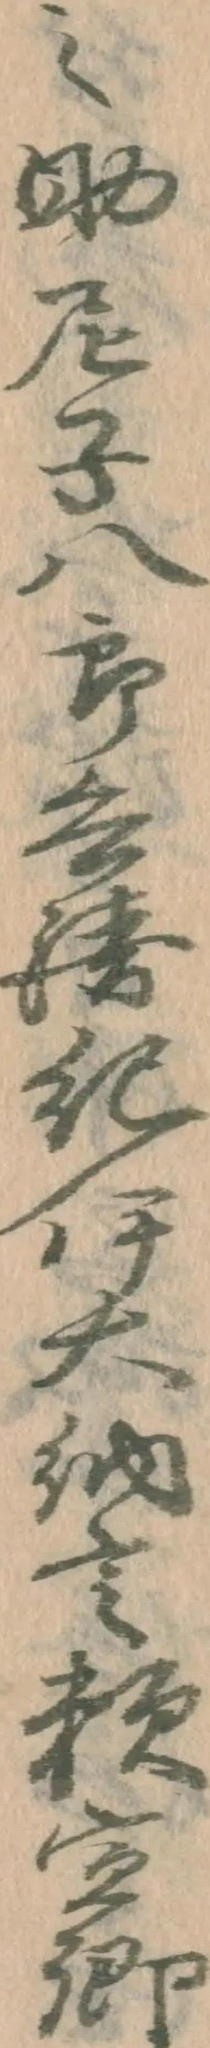之助尼子八郎兵衛紀伊大納言頼宣卿
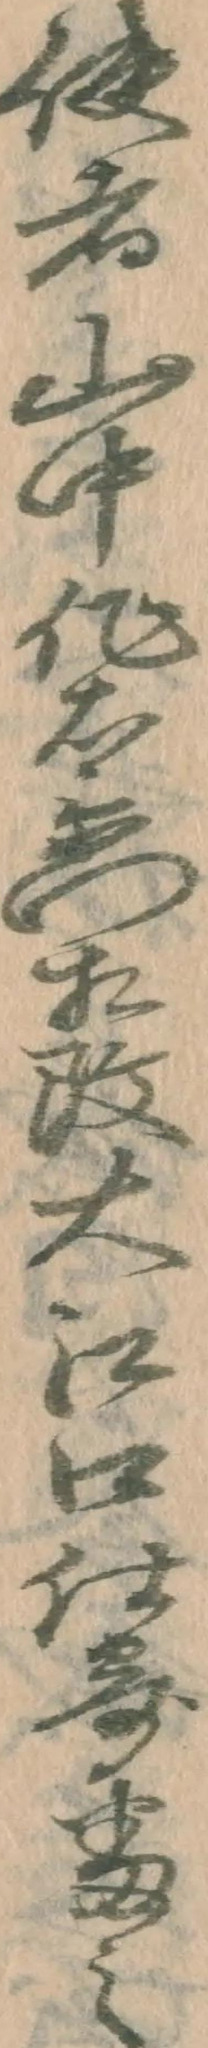使者山中作右衛門相改大江口仕寄番之
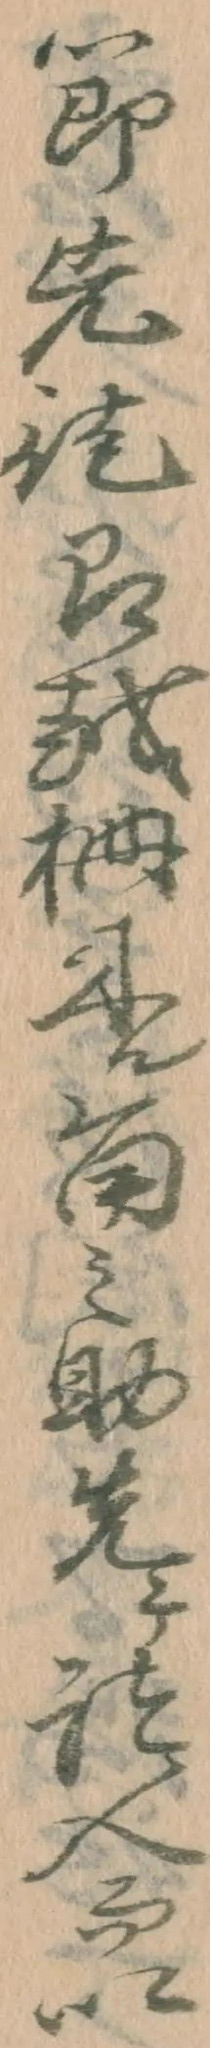節凶徒即越柵来る角之助先け諸人而以
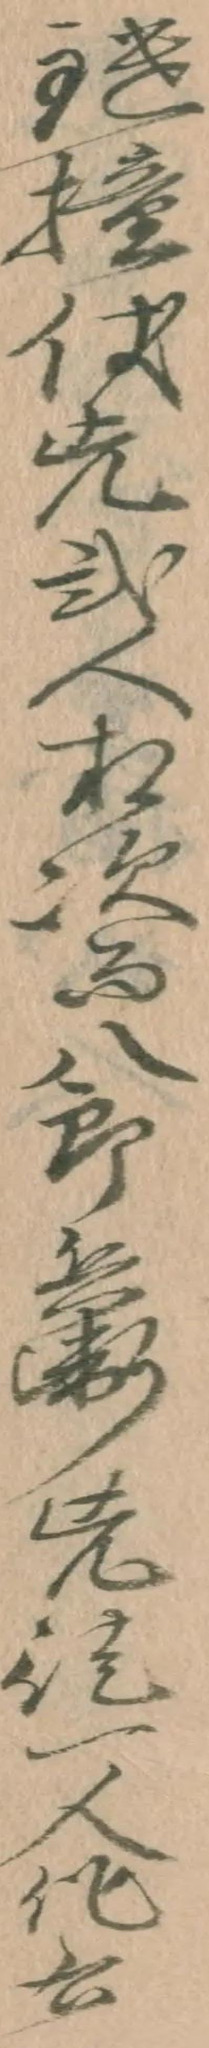鑓撞伏兇弐人相次而八郎兵衛兇徒一人作右
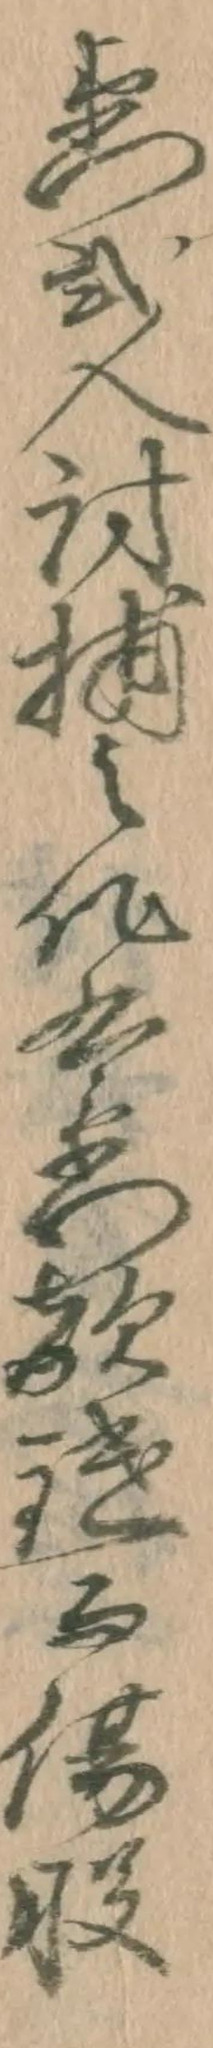衛門弐人討捕之作右衛門敵鑓而傷服

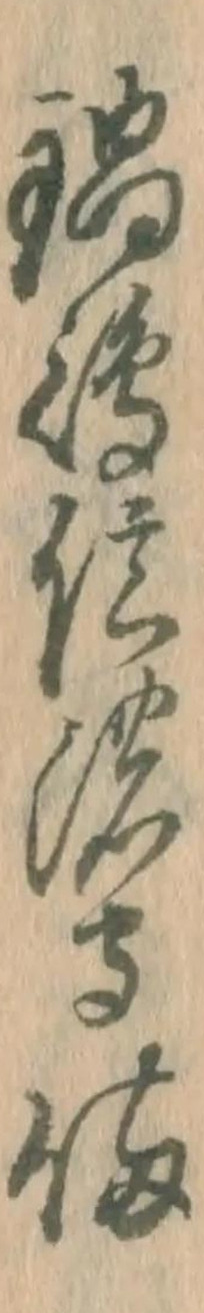鍋島信濃守手
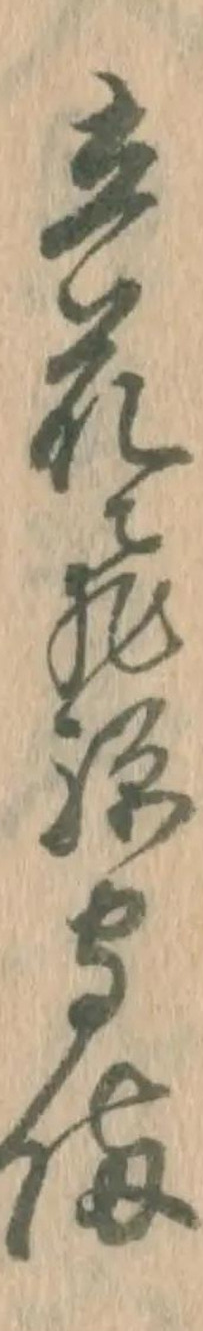立花飛騨守手
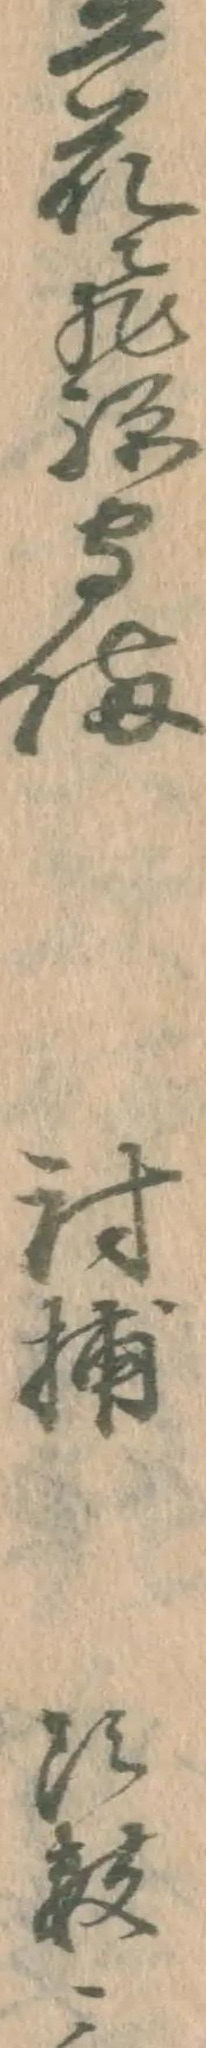立花飛騨守備討捕頭数三
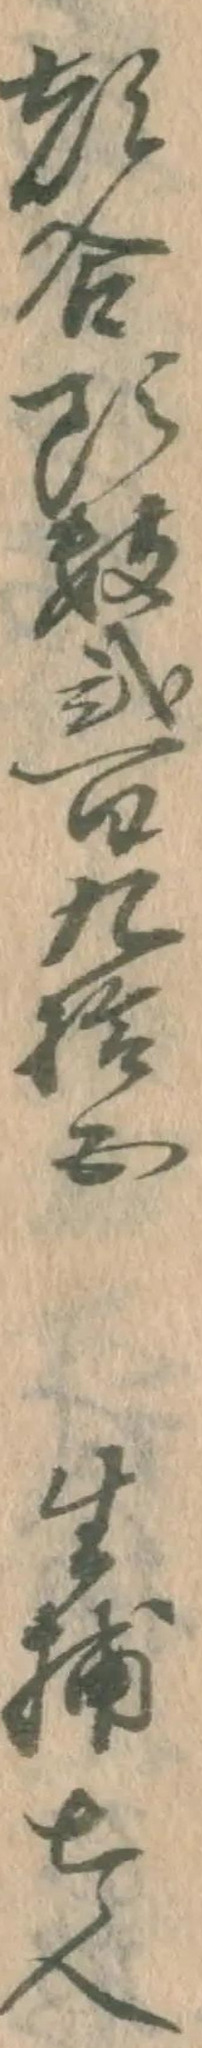都合頭数弐百九拾五生捕七人
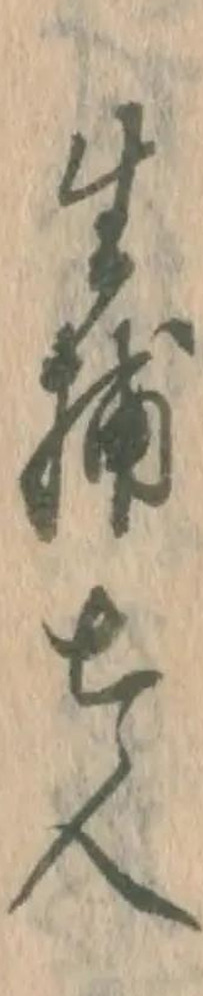生捕弐人
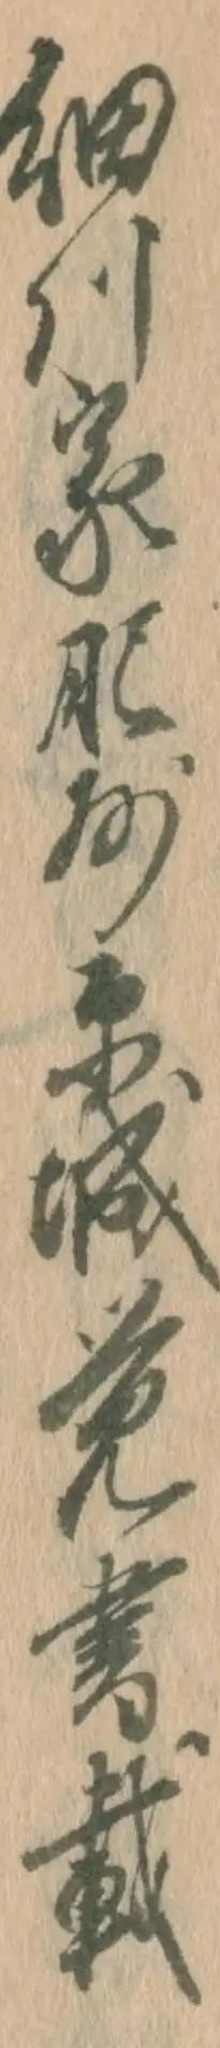細川家肥前原城覚書載
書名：切支丹御退治記 49巻. [7]
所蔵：国立国会図書館 National Diet Library, JAPAN
